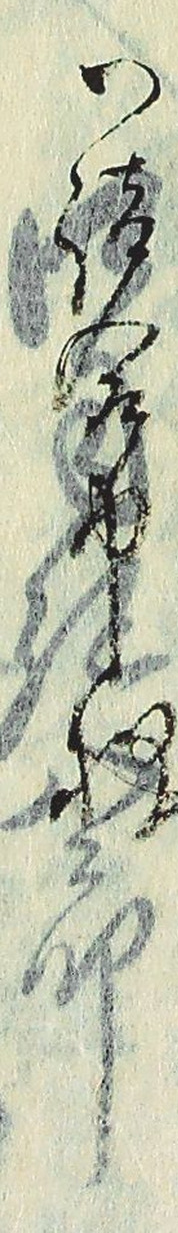御請合中様
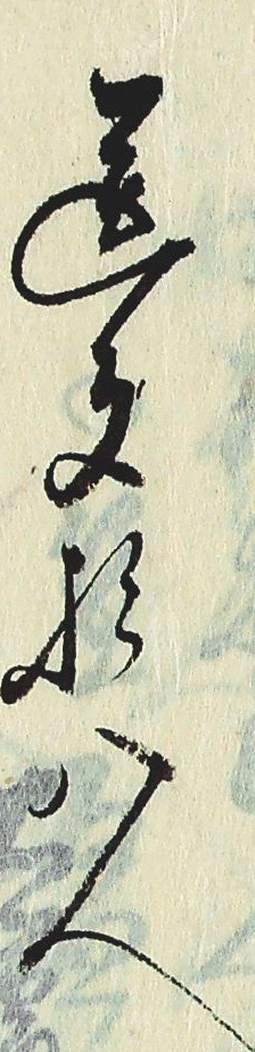送夫拾八人
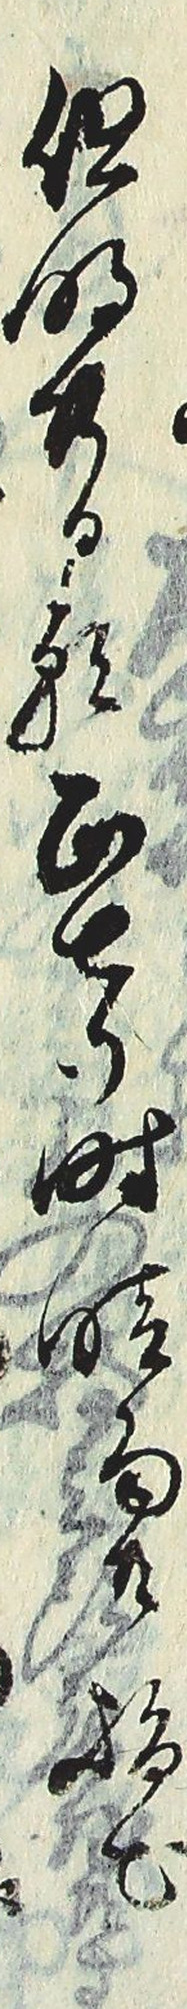但明廿日朝正七つ時晴雨共指出
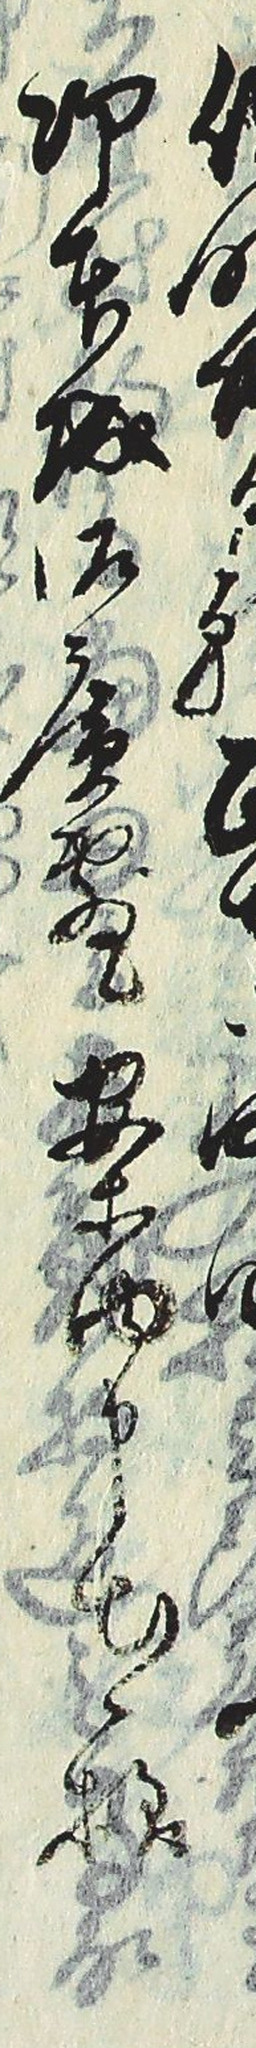御本城御広敷へ案内申出候様

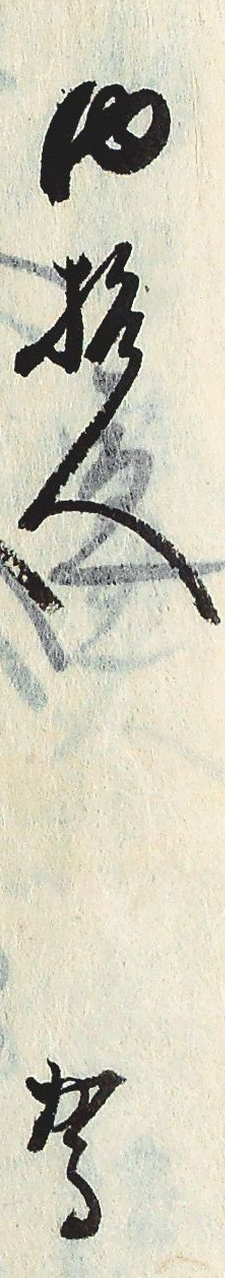内拾人駕
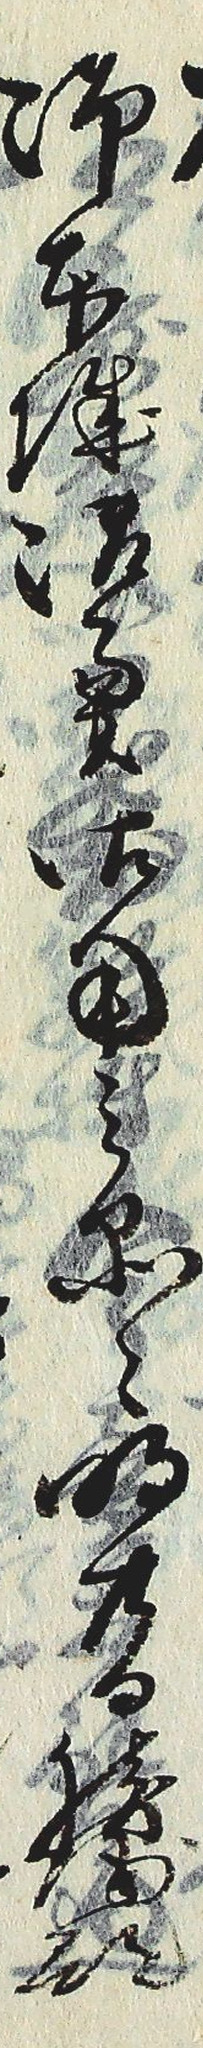御本城御奥御用之品々明廿日勝浦郡
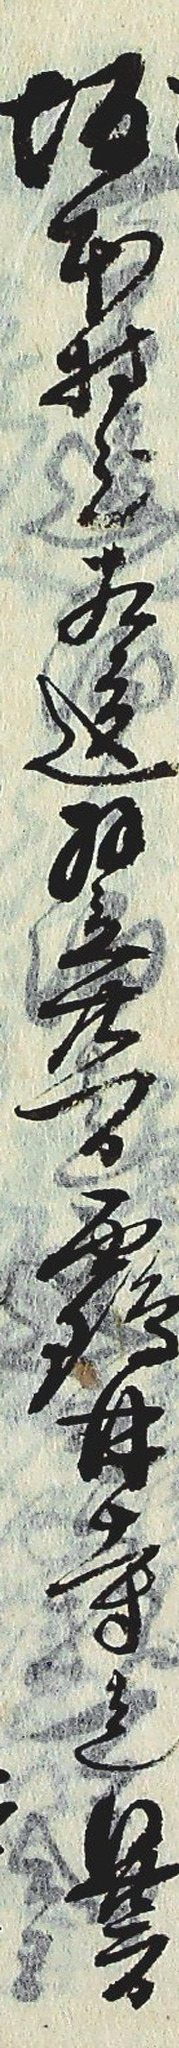坂本村迄相送翌廿一日鶴林寺迄同廿二日
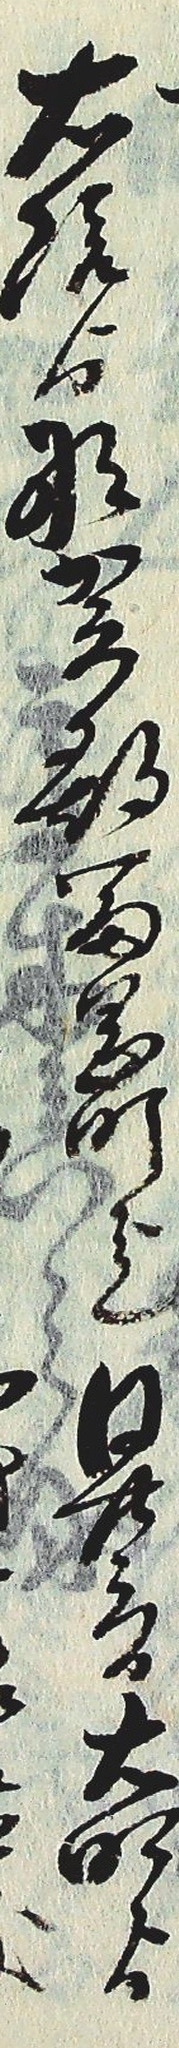右院ゟ那賀郡富岡町迄同廿三日右町ゟ
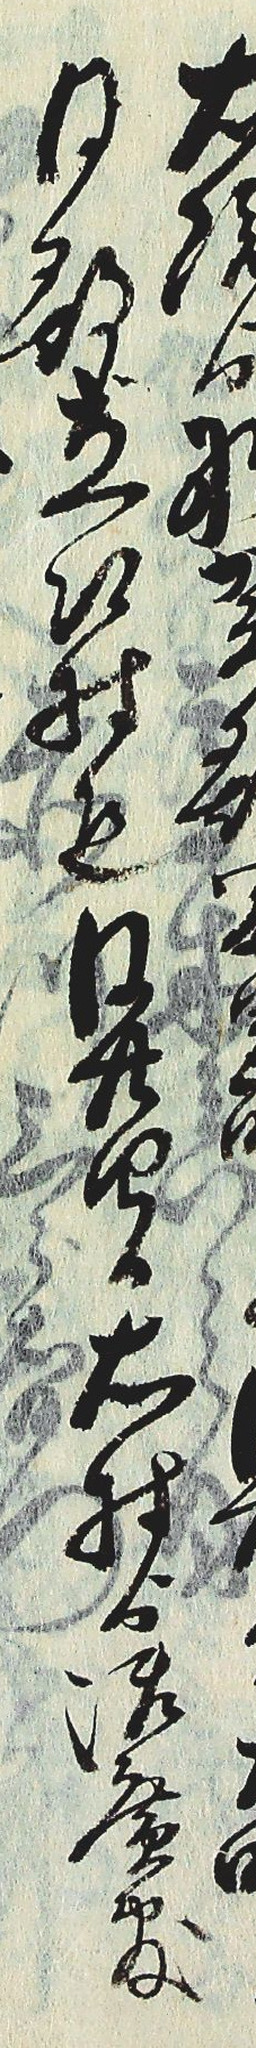同郡立江村迄同廿四日右村ゟ御広敷
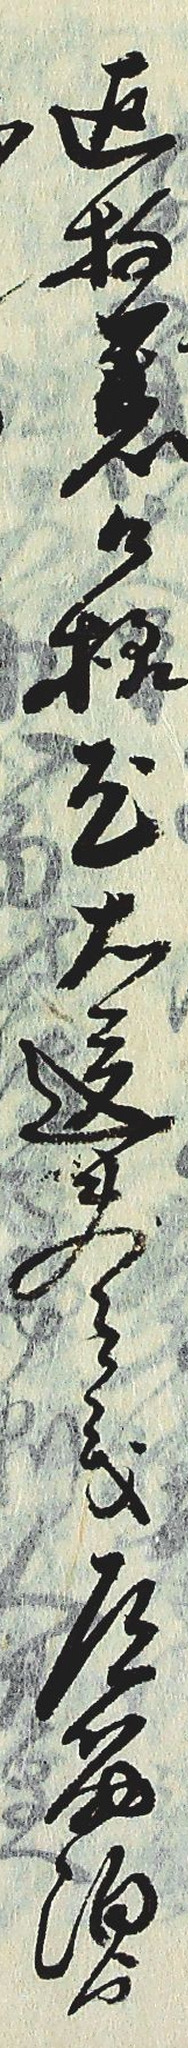迄持着候様尤右送夫之義道筋泊ゟ
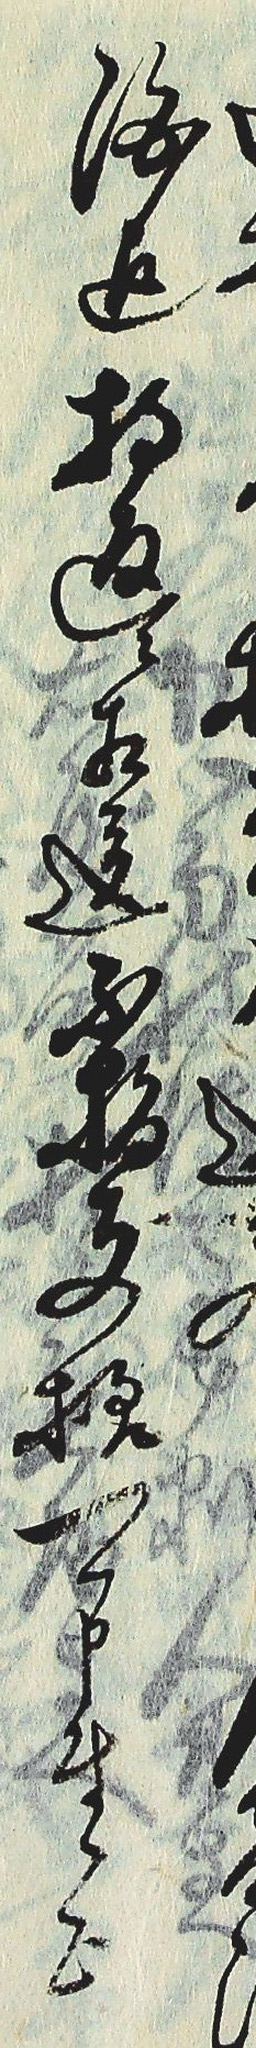泊迄持通に相送不指支様可申付候以上
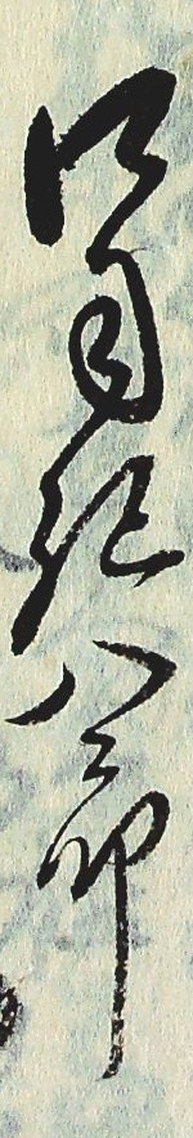郷司紀八郎
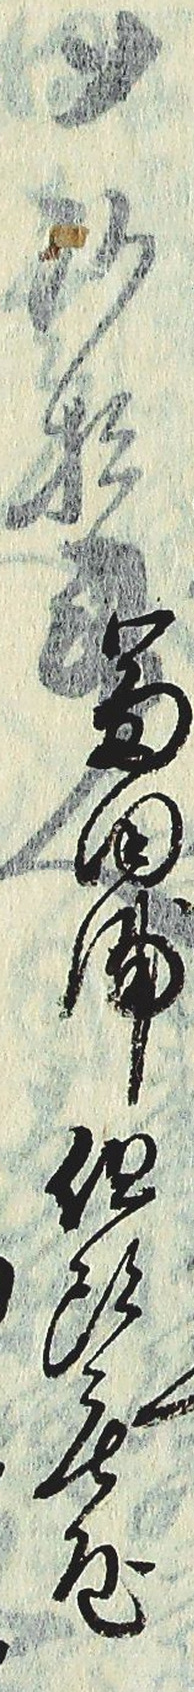冨田浦組頭庄屋
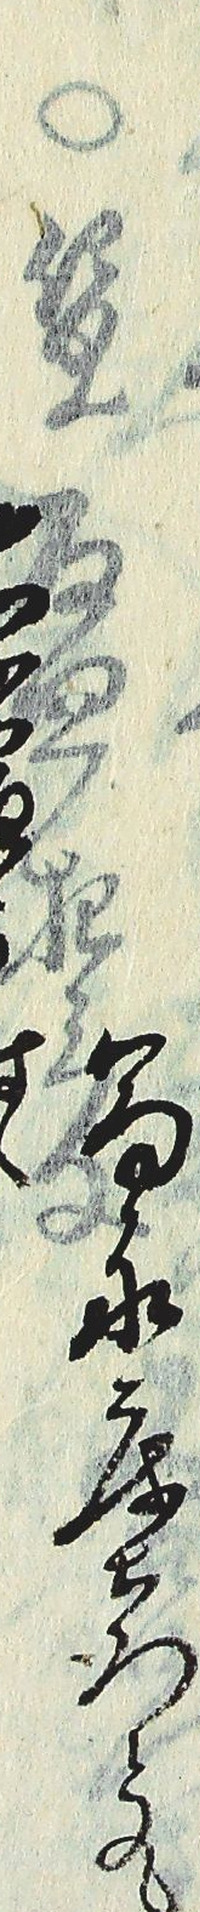富永茂右衛門
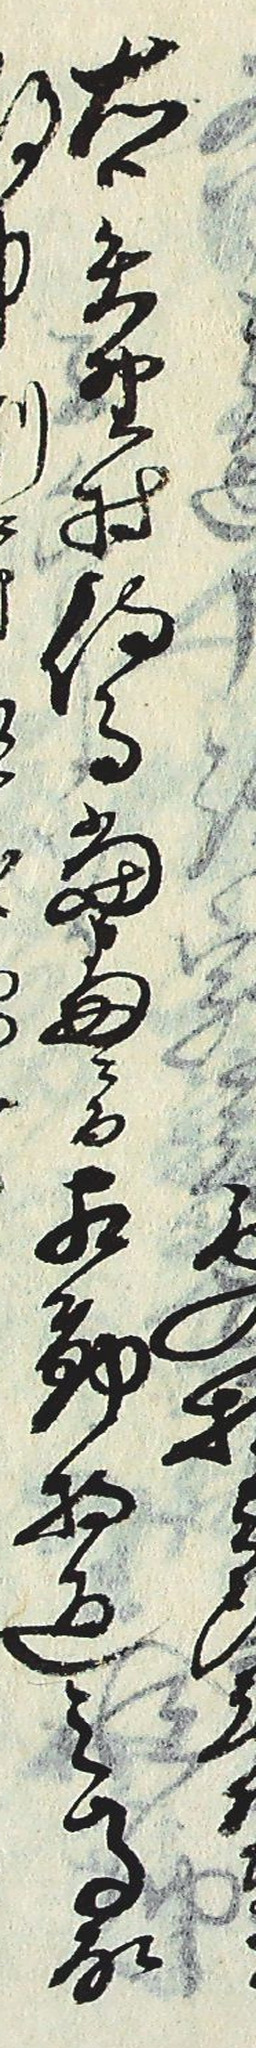右は矢野村伝馬当番にて相勤持通之御事故
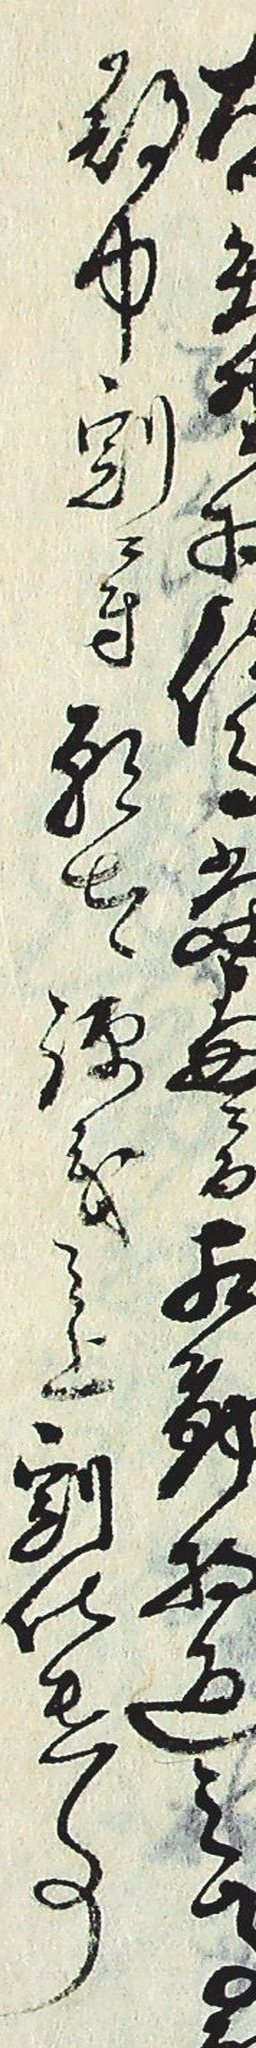郡中割に付願出候評義之上割仕遣事
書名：名東郡中諸割賦元帳
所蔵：鳴門教育大学 Naruto University of Education
